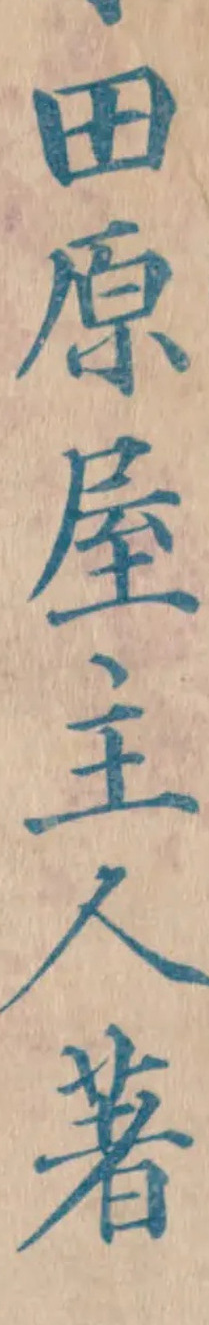小田原屋主人著
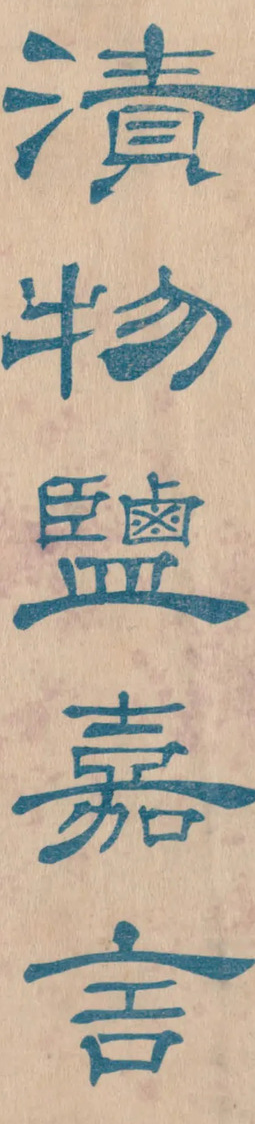漬物塩嘉言
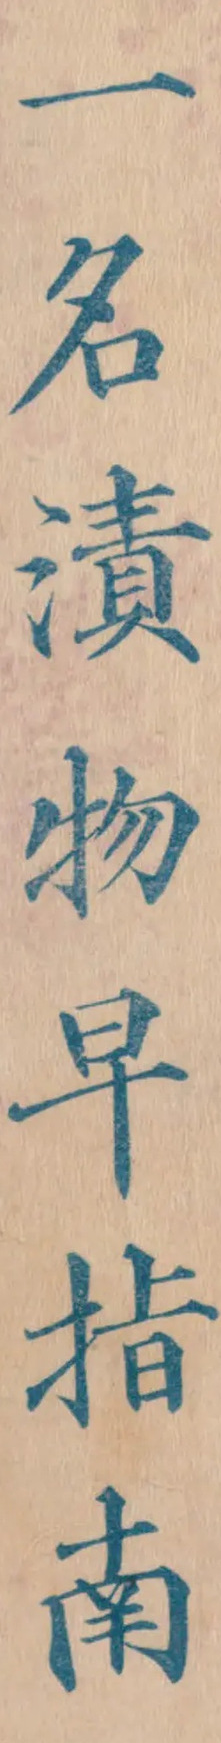一名漬物早指南
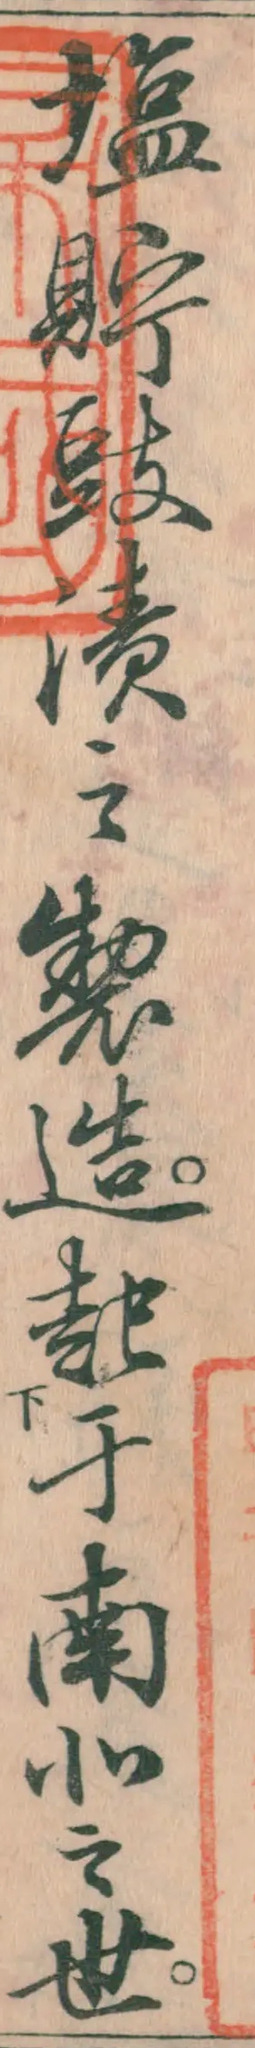塩貯鼓漬之製造。起于南北之世。

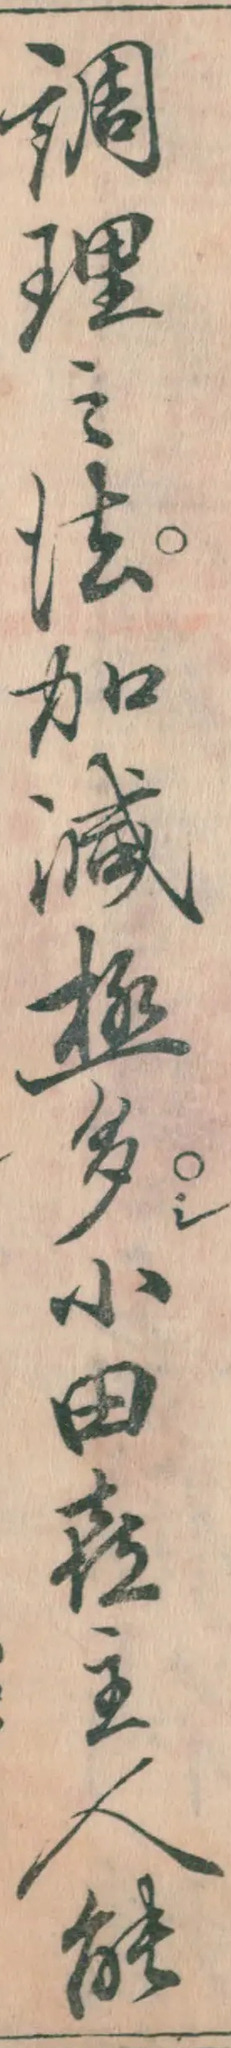調理之法。加減極多。小田喜主人能
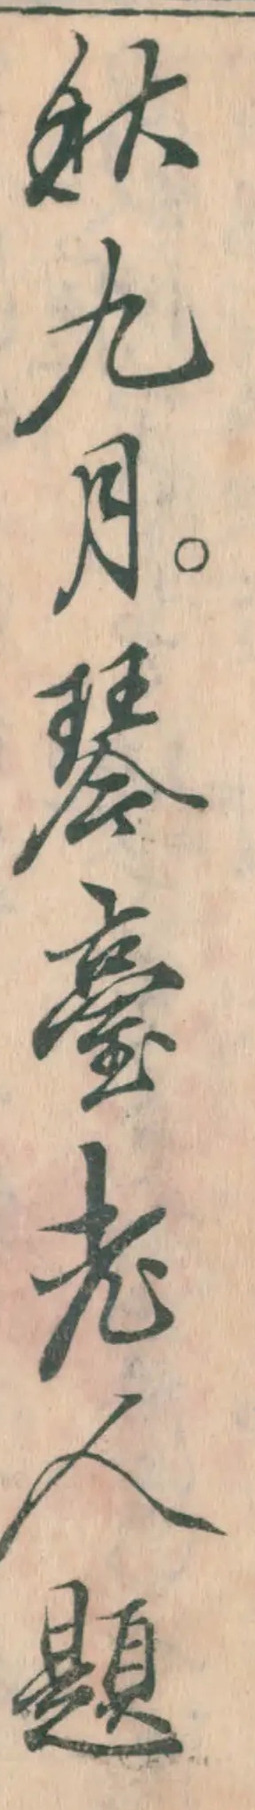秋九月。琴臺老人題

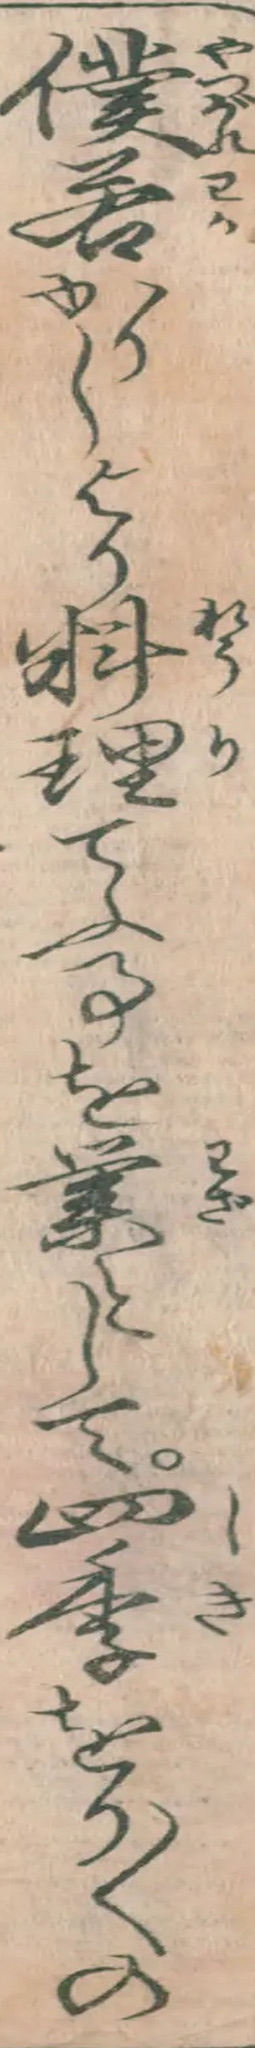僕若かりしより料理てふ事を業として。四季をり〳〵の
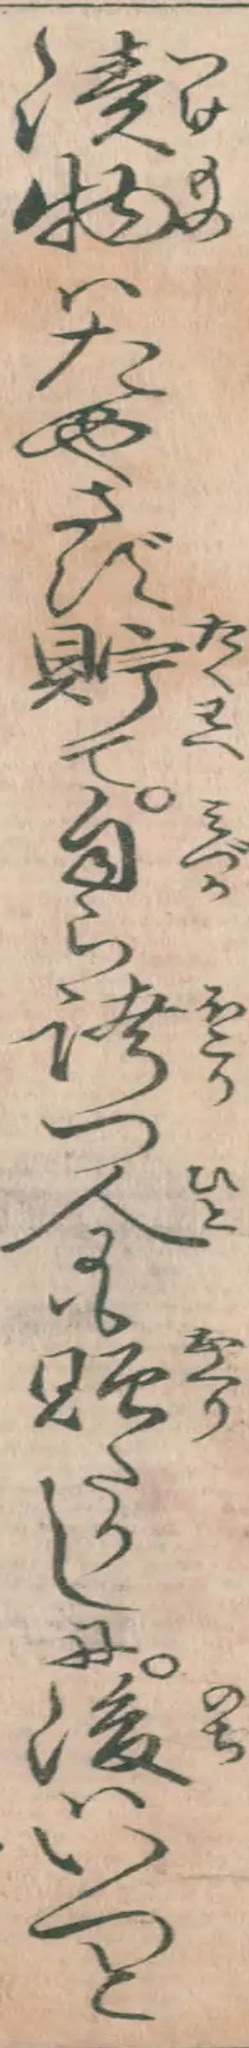漬物はたやさず貯て。自ら誇つ人にも贈たりしに。後はいつと
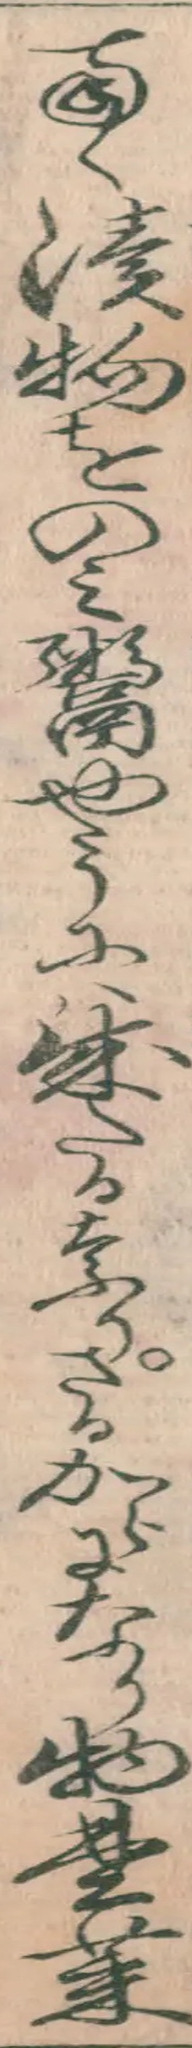なく漬物をのみ鬻やうには成たるなり。さるからになり物野菜
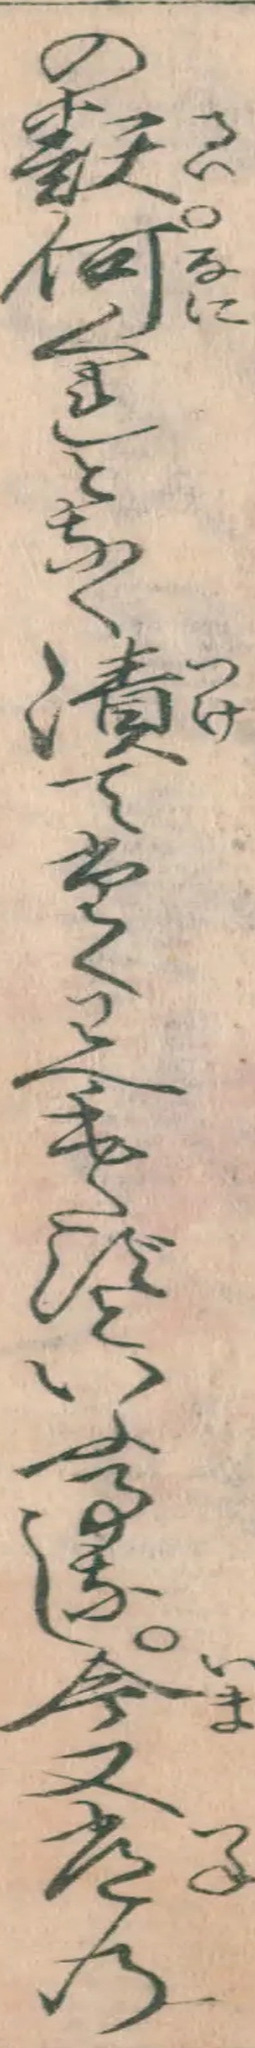の類。何くれとなく漬てたくわへもたずといふ事なし。今又常の
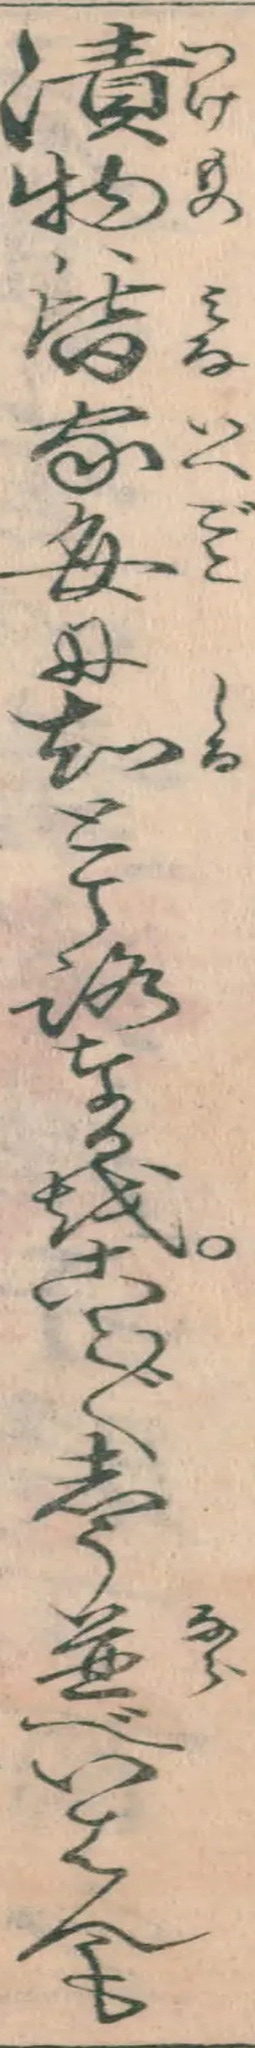漬物は皆家毎に知ところなるを。こと〴〵しう並べいはんも
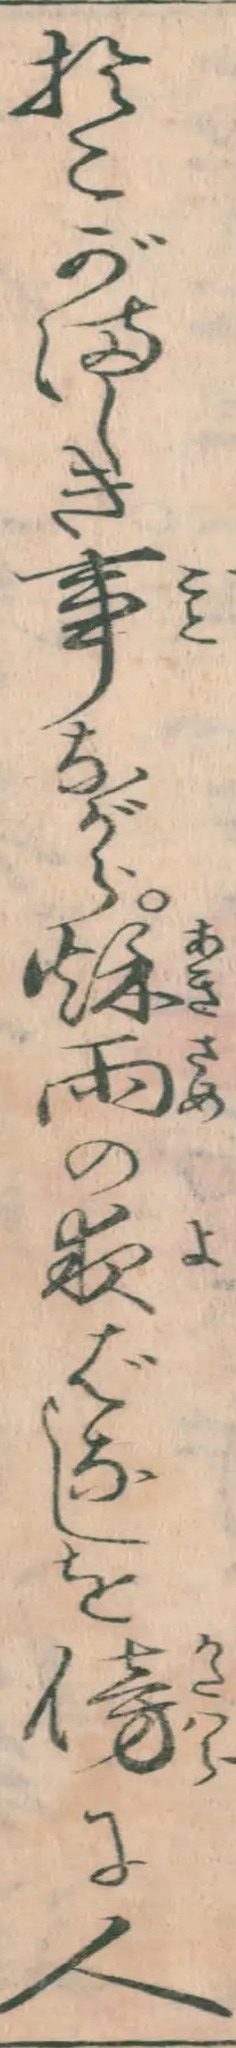おこがましき事ながら。秋雨の夜ばなしを傍に人
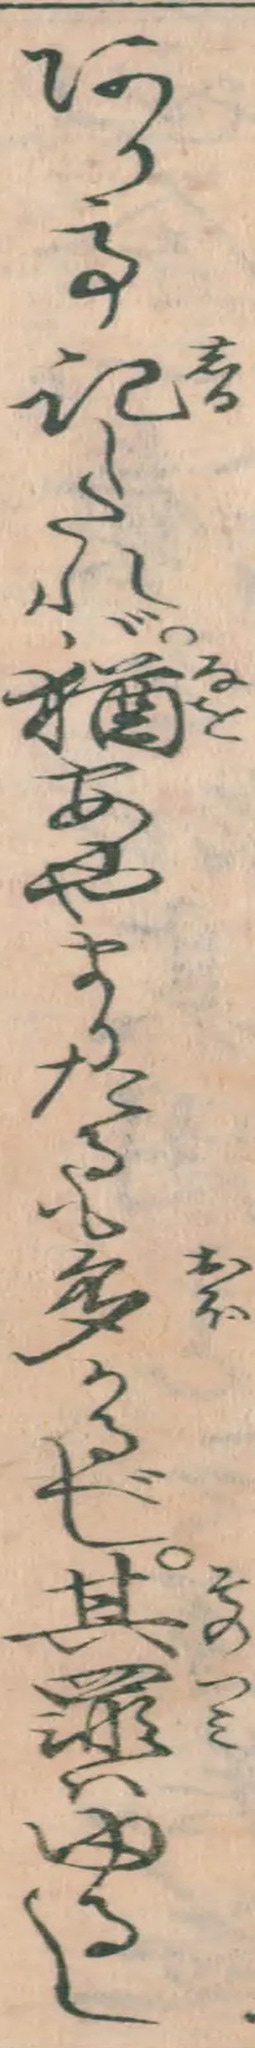ありて記したれば。猶あやまりたるも多かるべし。其罪はゆるし
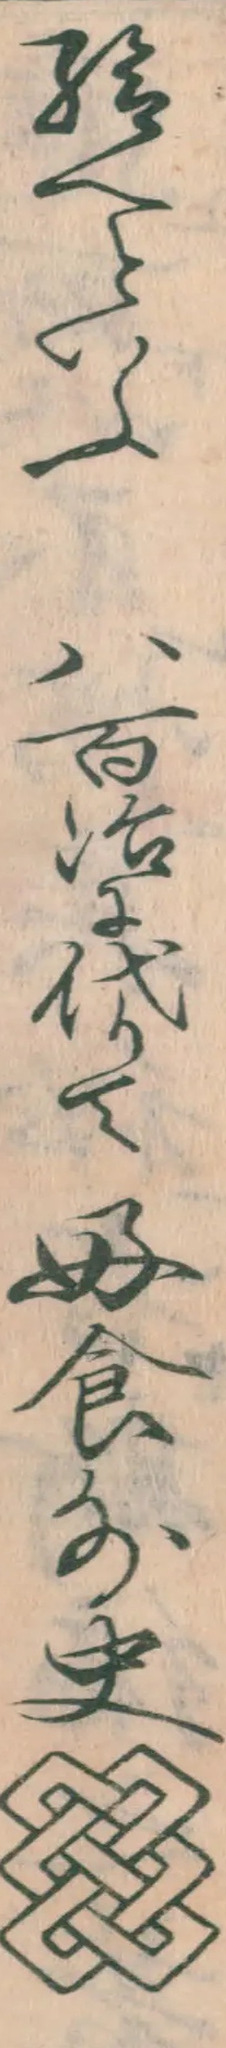給へといふ八百治に代りて好食外史
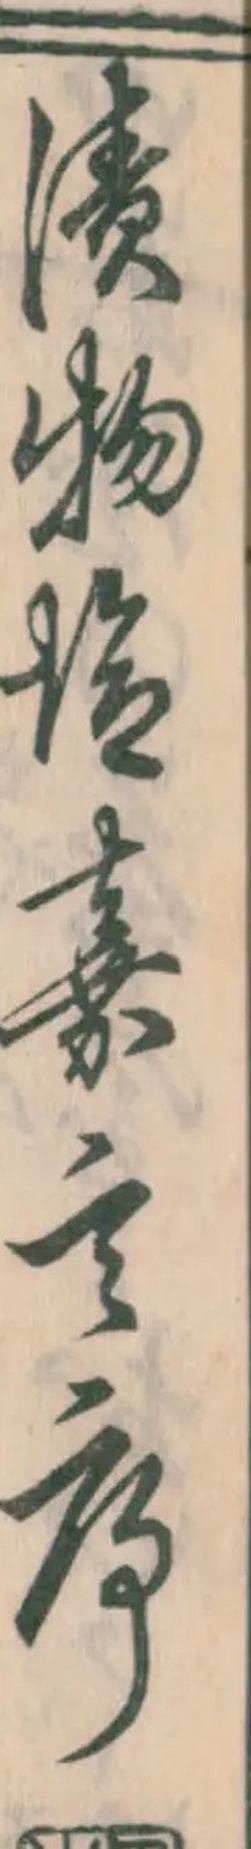漬物塩嘉言序
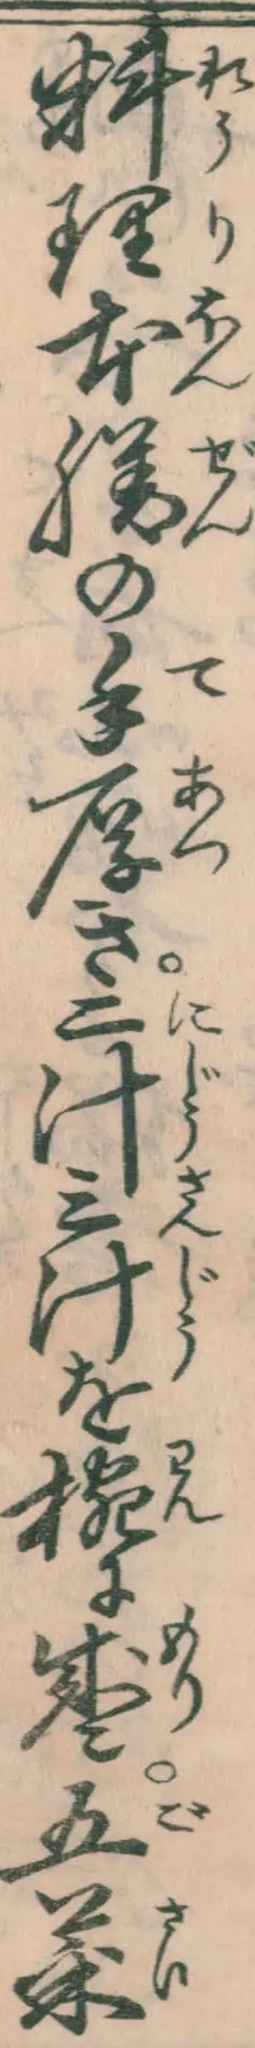料理本膳の手厚き。二汁三汁を椀に盛。五菜
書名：四季漬物鹽嘉言
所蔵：国立国会図書館 National Diet Library, JAPAN
